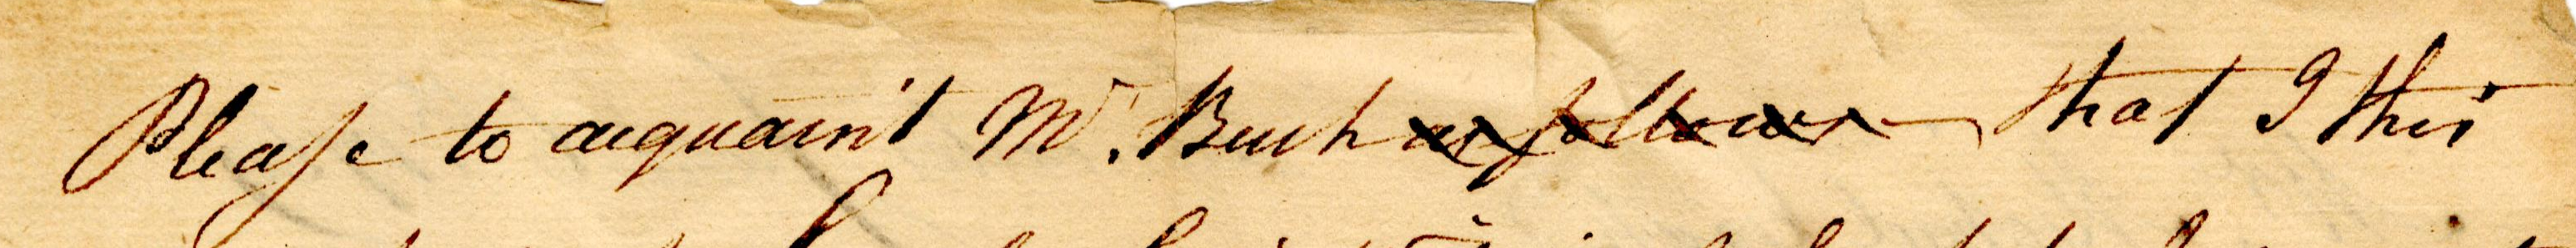Please to acquaint M^r Bush [as follows]- that I this
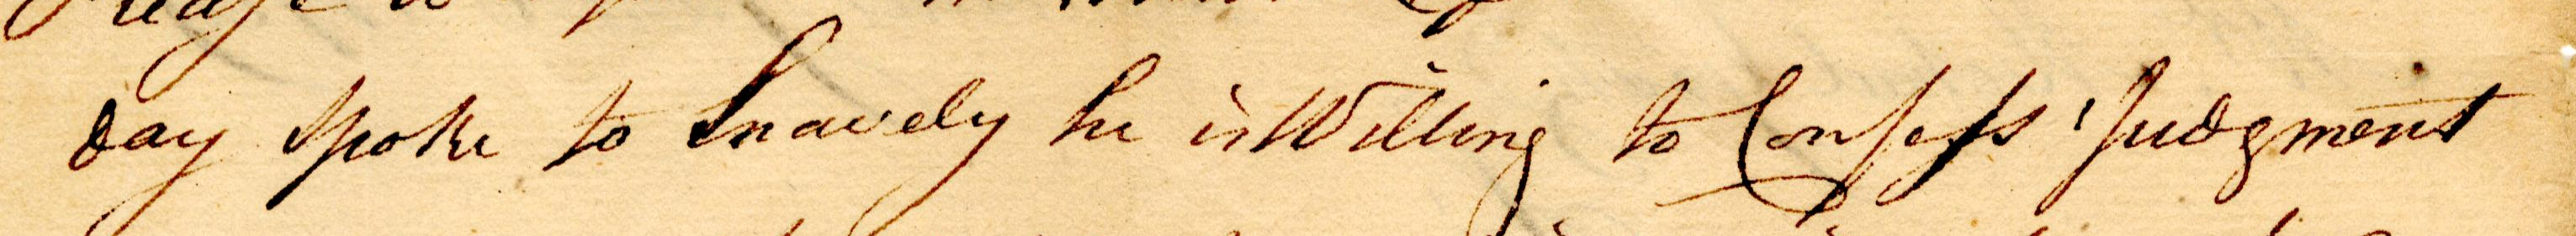day spoke to Snavely he is Willing to Confess Judgment
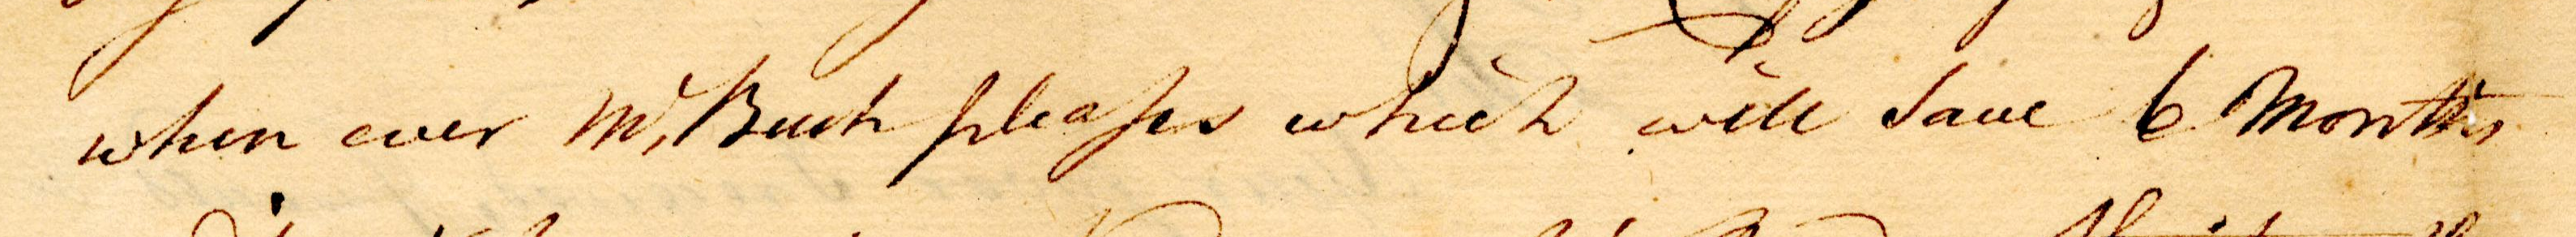when ever M^r Bush pleases which will Save 6. Months
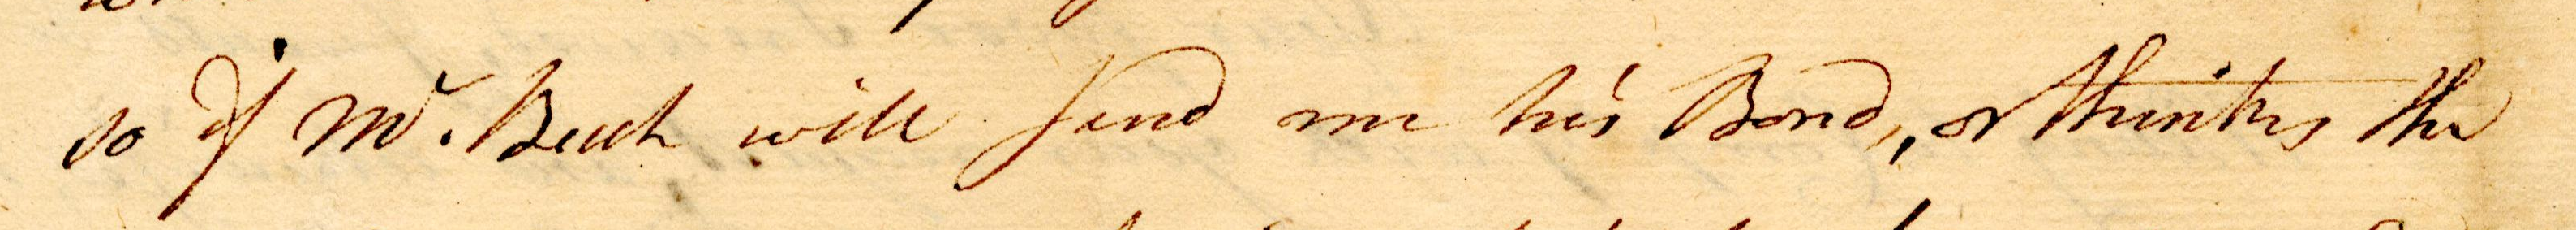so if M^r Bush will send on his Bond, or thinks the
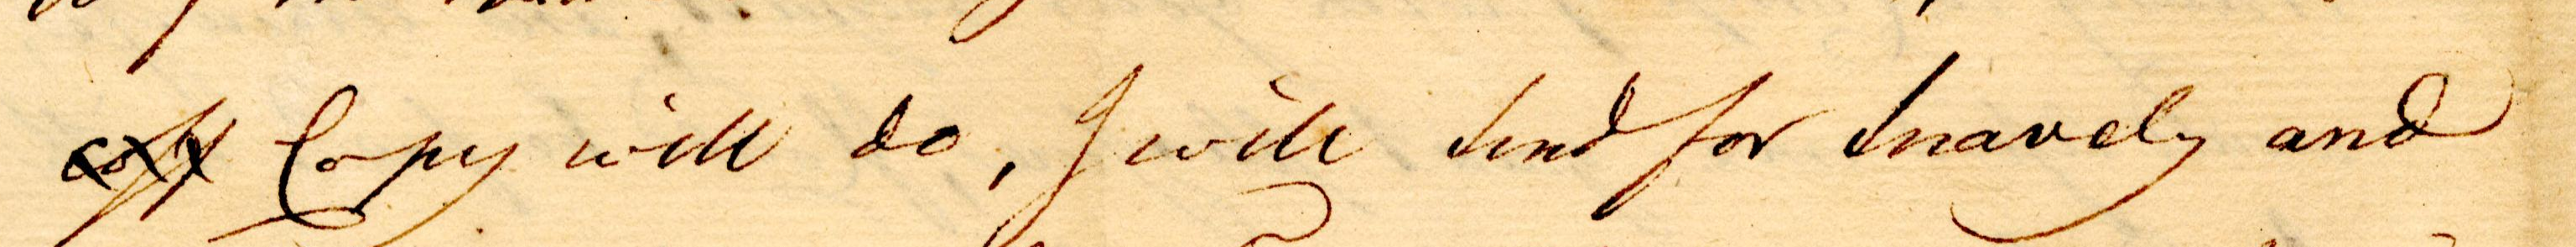[cop] Copy will do, I will send for Snavely and
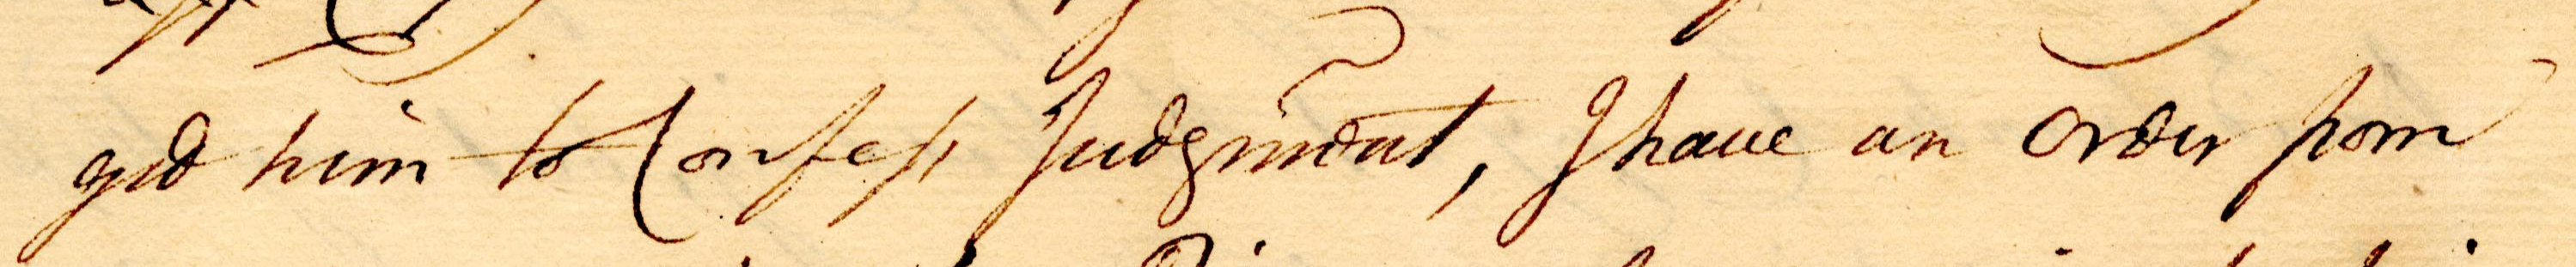ged him to Confess Judgement, I have an order from
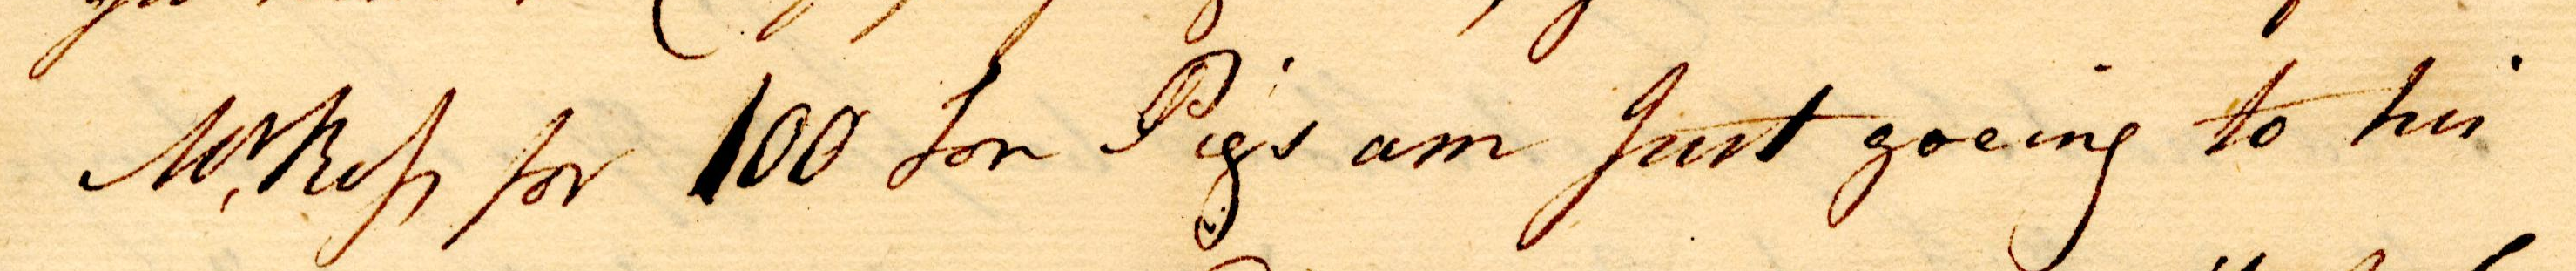M^r Ross for 100 Ton Pigs am just goeing to his
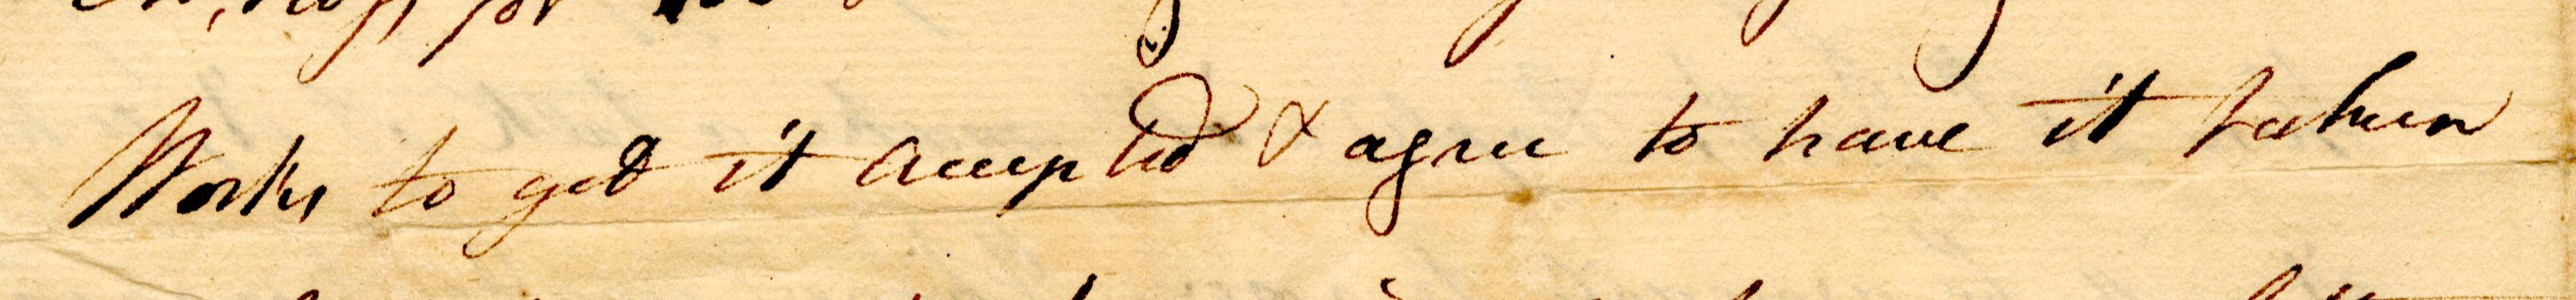Works to God it Accepted & agree to have it taken
